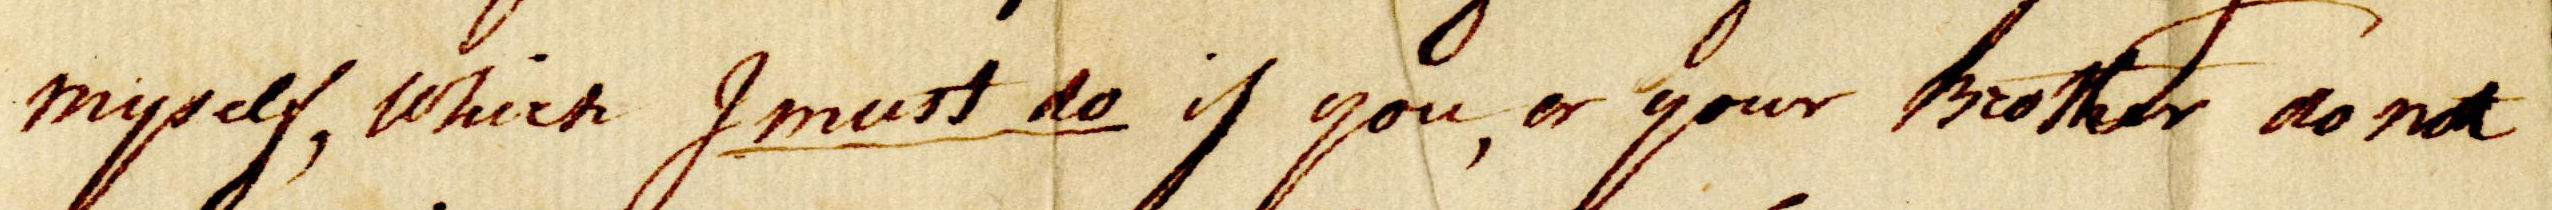myself, Which I must do if you, or your Brother do not
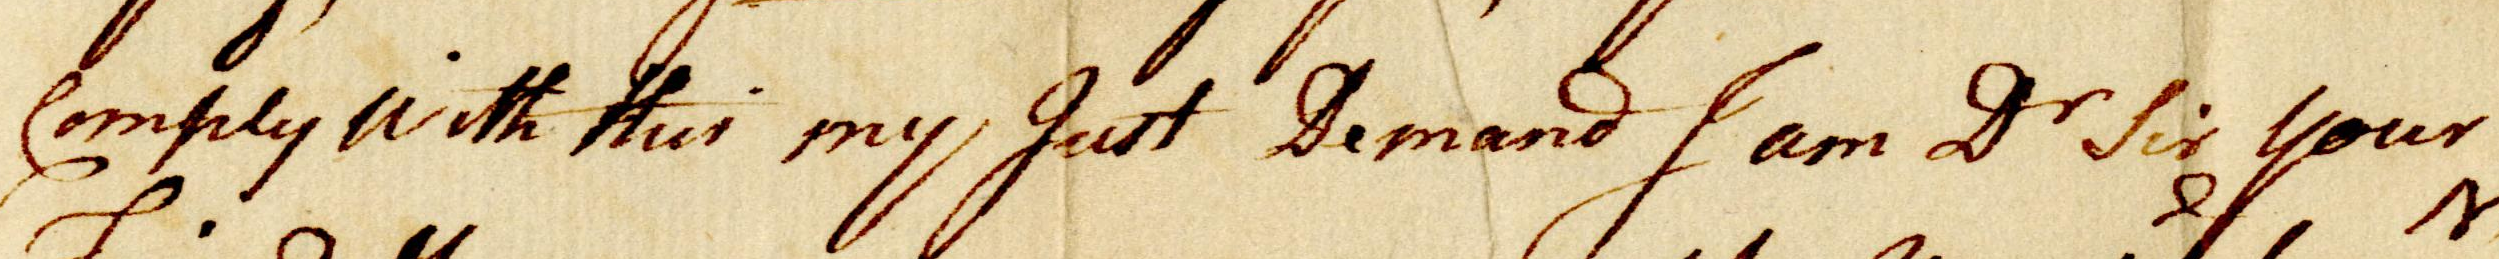comply with this my Just Demand I am D^r Sir your
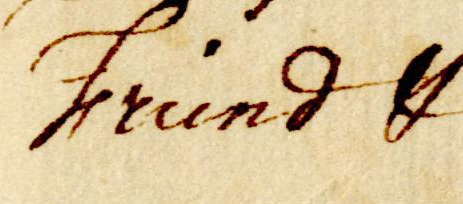Friend &
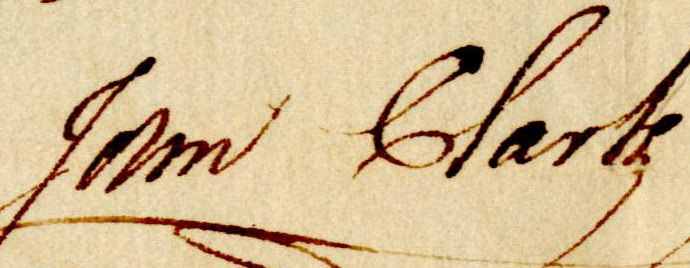John Clark
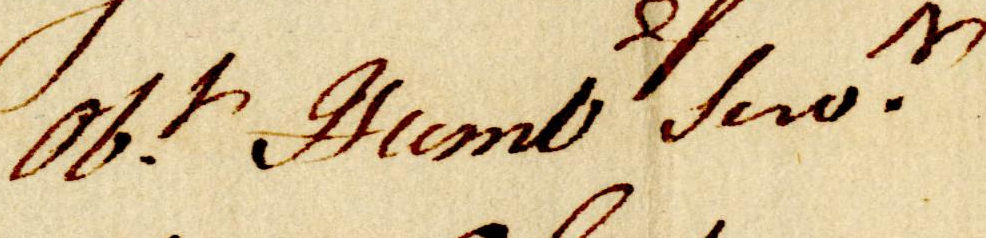ob^t Humb^l Serv^t.
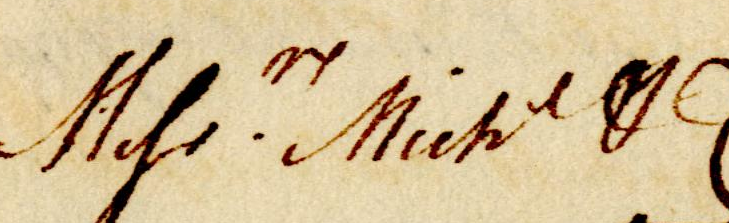Mess^rs Mich^l &
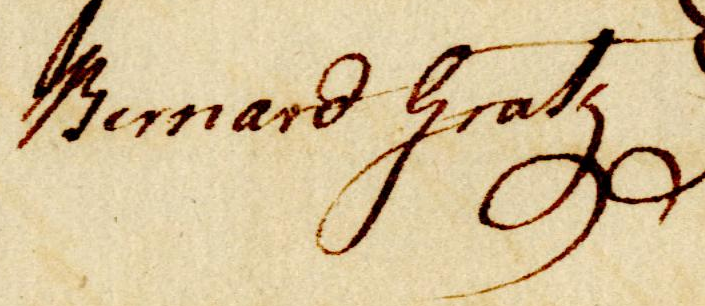Barnard Gratz
